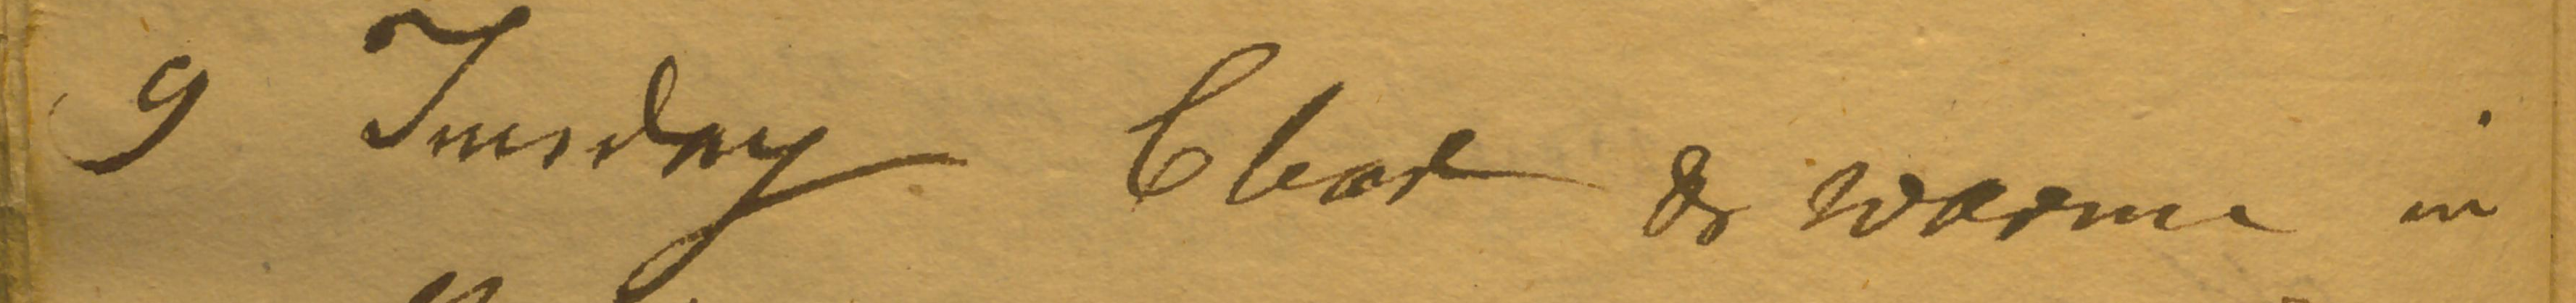9 Tuesday Clear & warme in
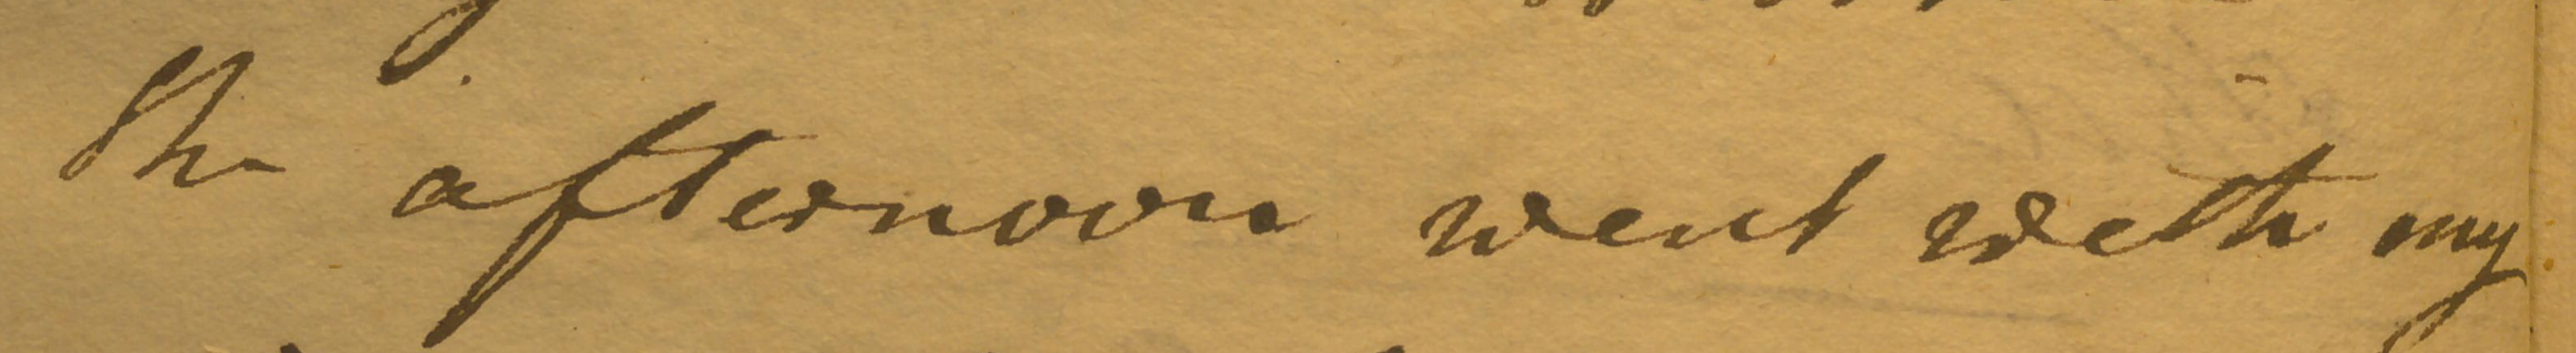the afternoon went with my
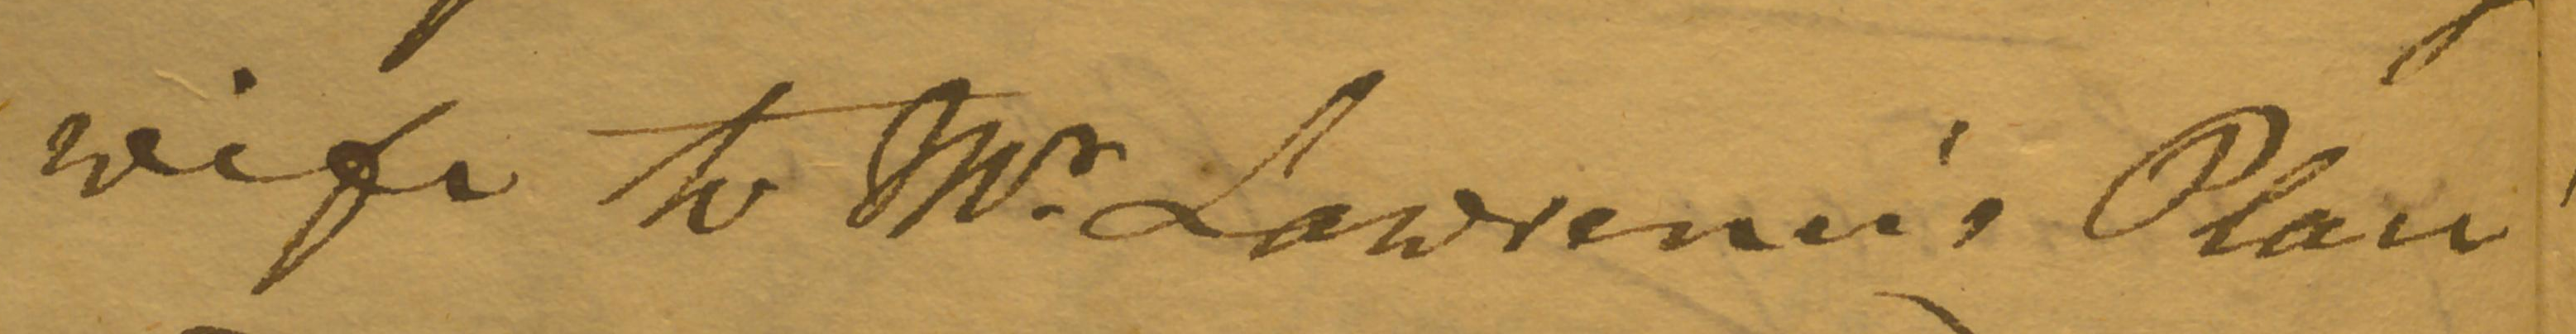wife to M^r. Lawrence's Place
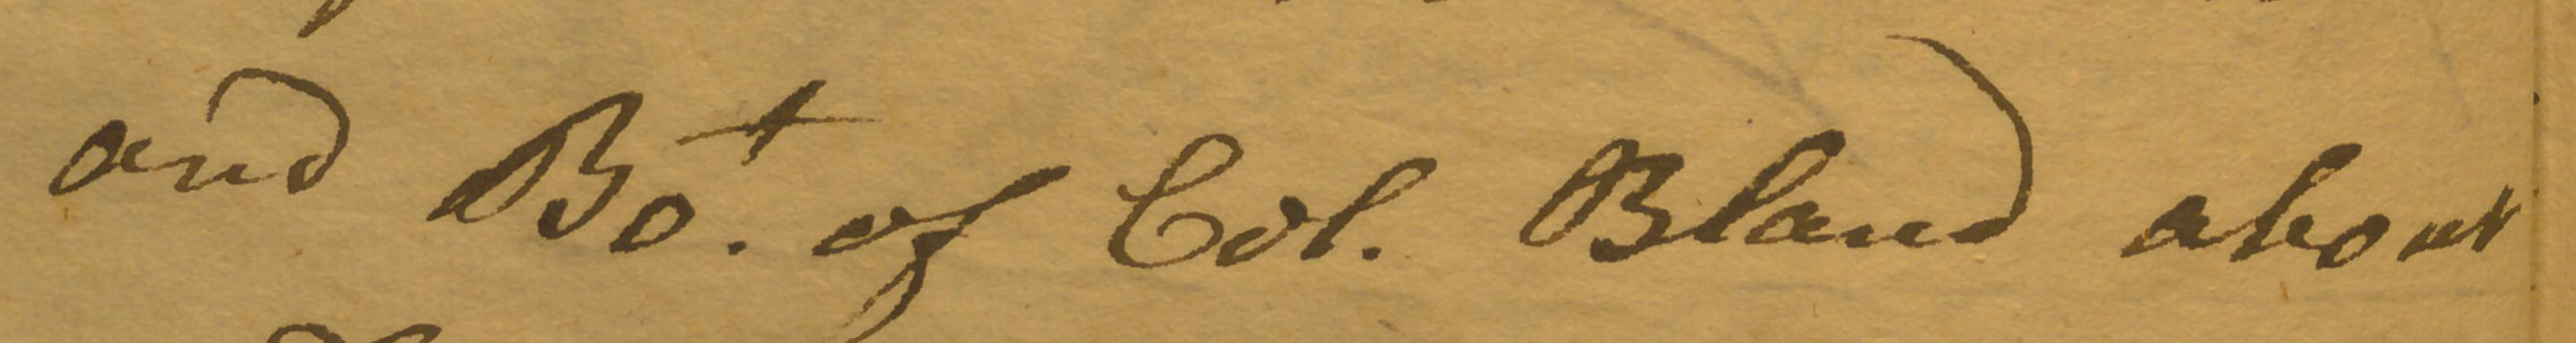and Bo^t. of Col. Bland about
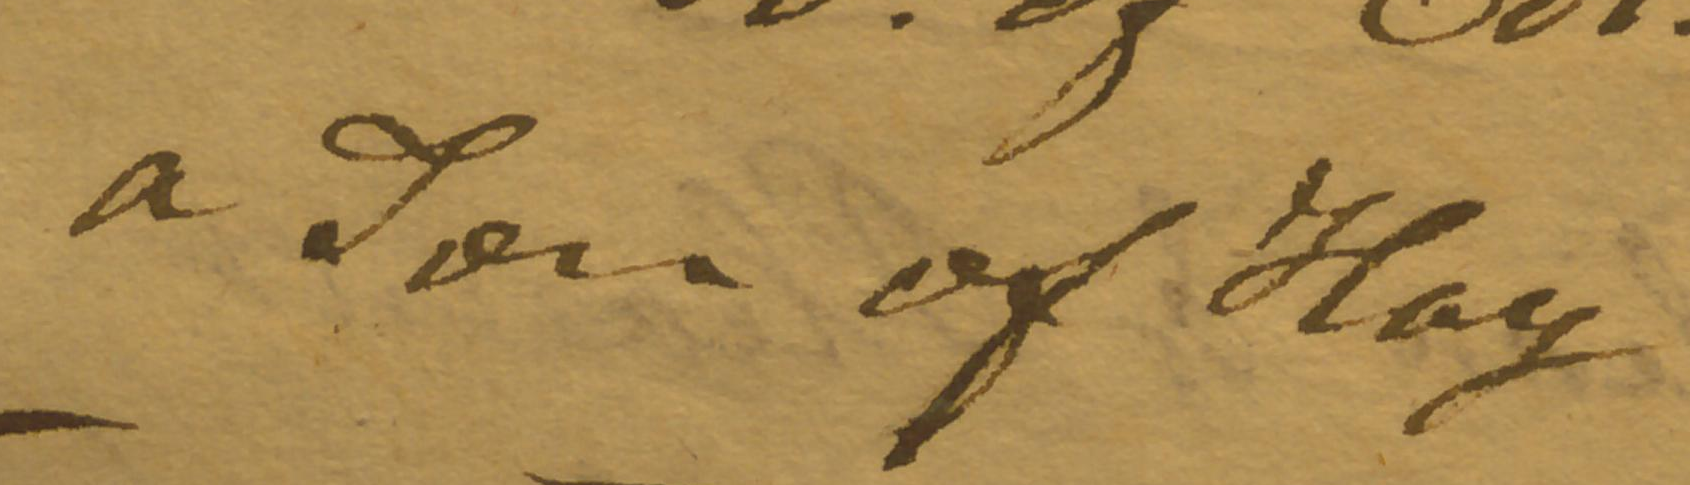a Ton of Hay
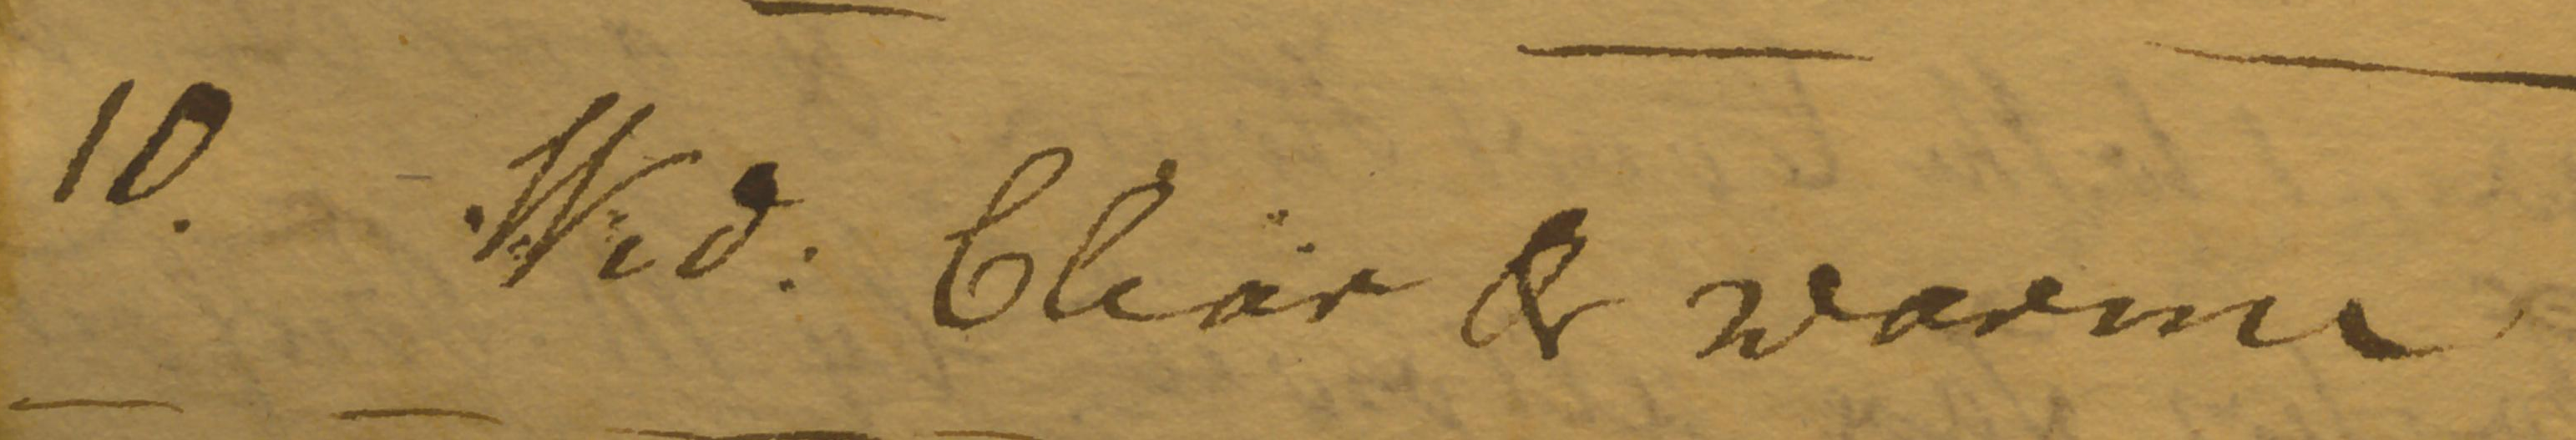10. Wed. Clear & warme
